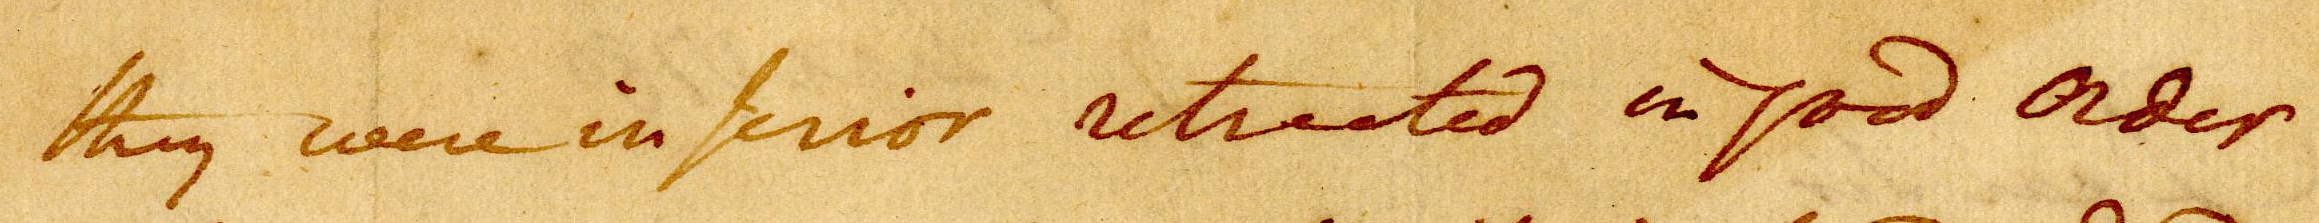they were inferior retreated in good Order
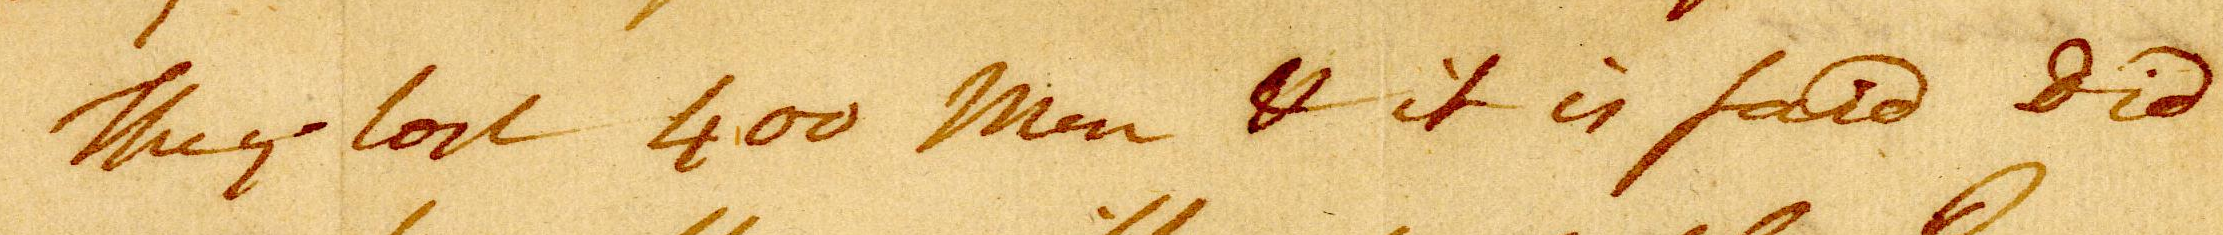they lost 400 Men & it is said did
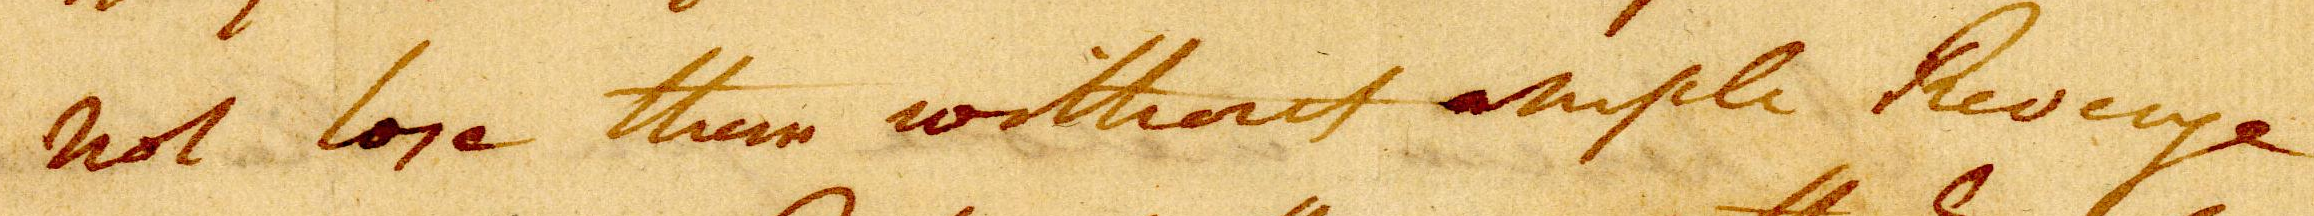not lose them without ample Revenge
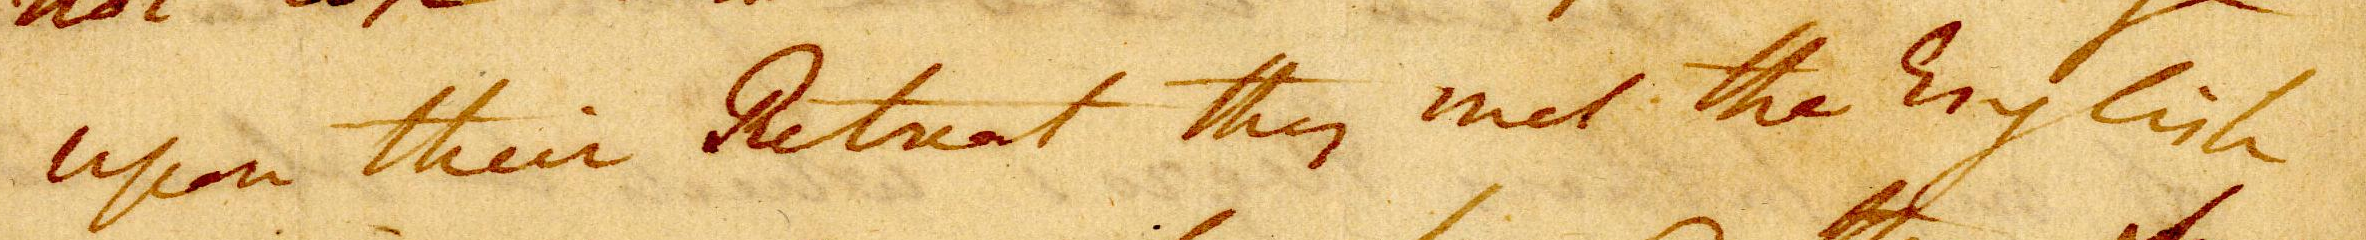upon their Retreat they met the English
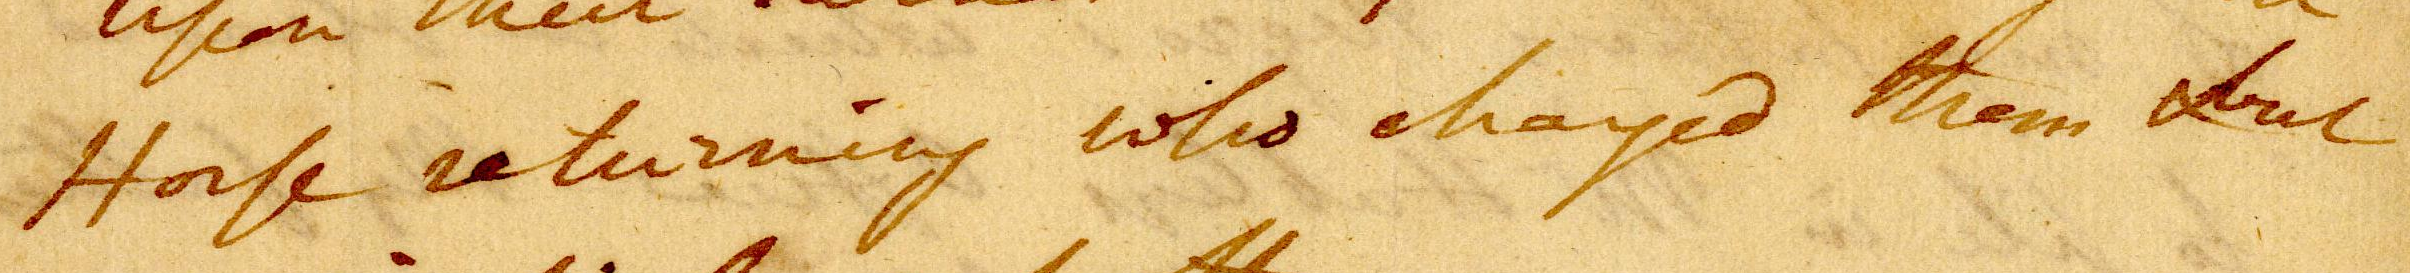Horse returning who charged them but
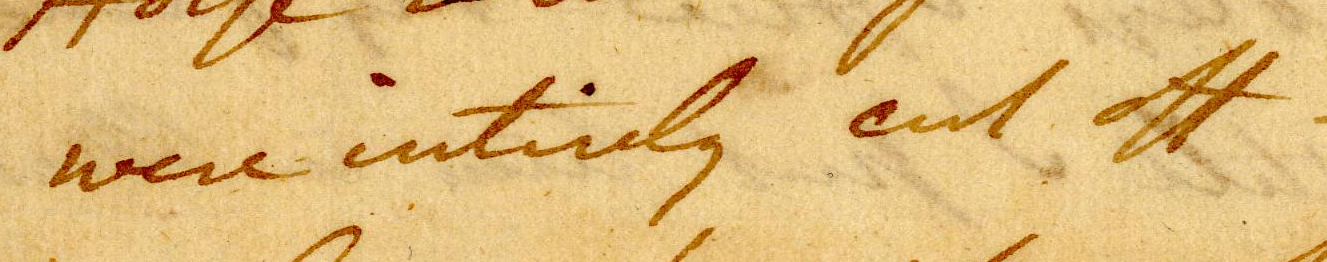were intirely cut off
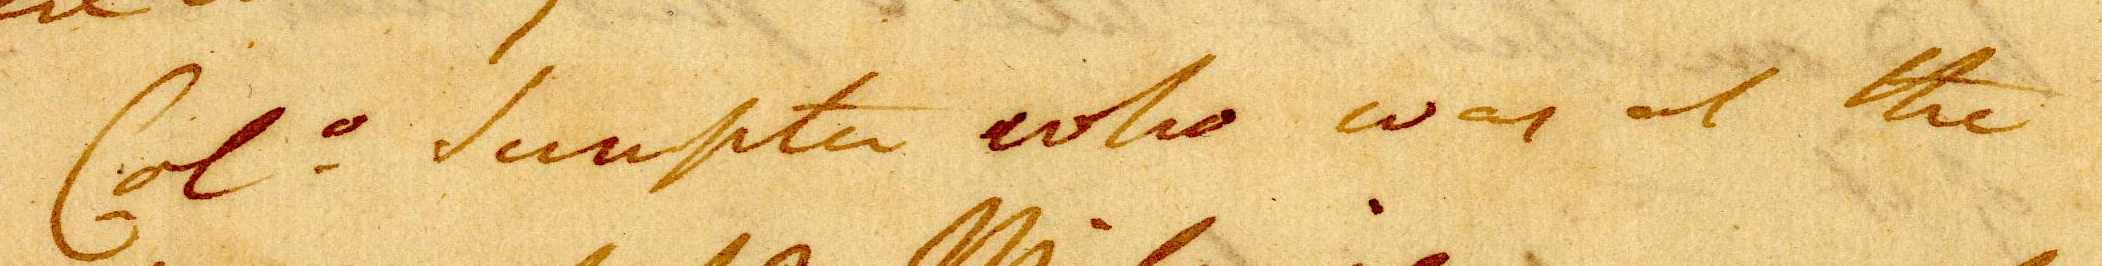Col^o. Sumpter who was at the
